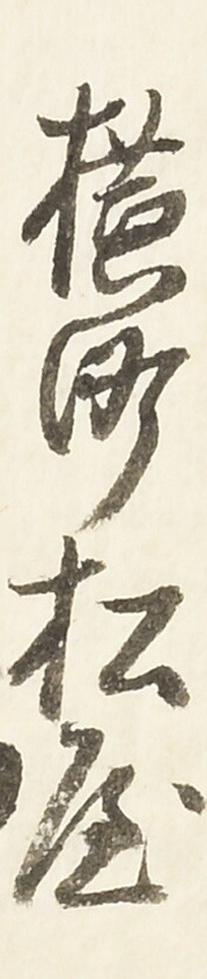横町松屋
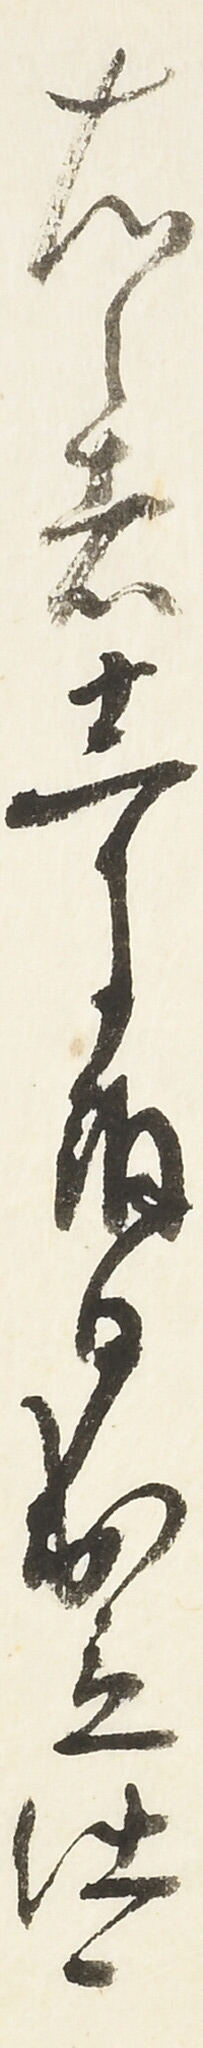右之者十二月朔日出立仕候
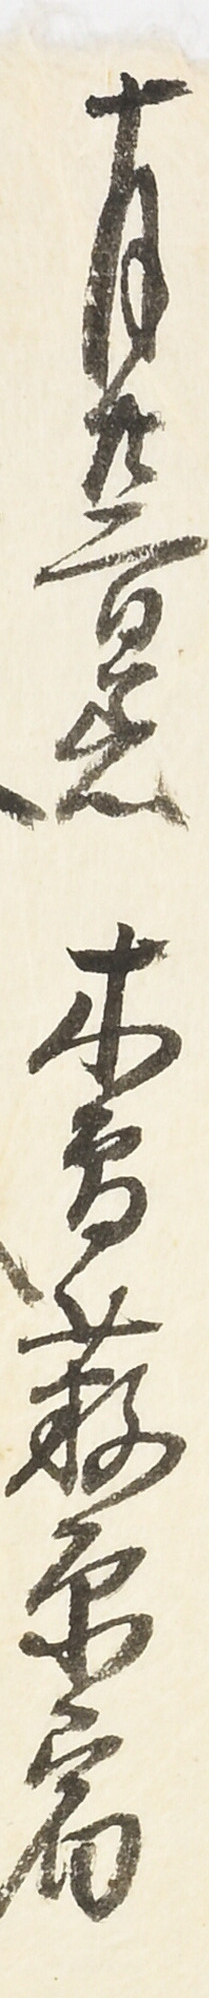十月廿二日着木曽藪原宿
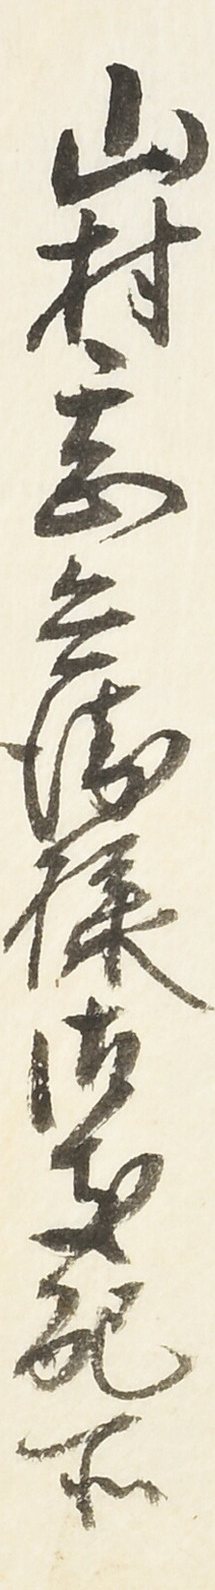山村甚兵衛様御支配所
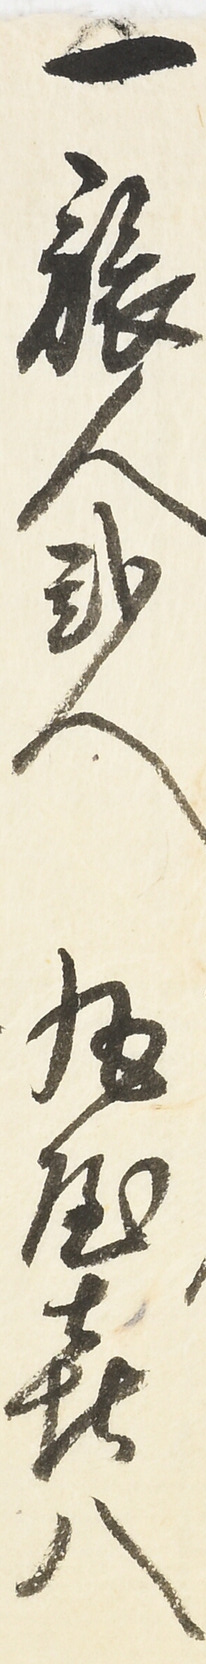一旅人弐人丸屋喜八
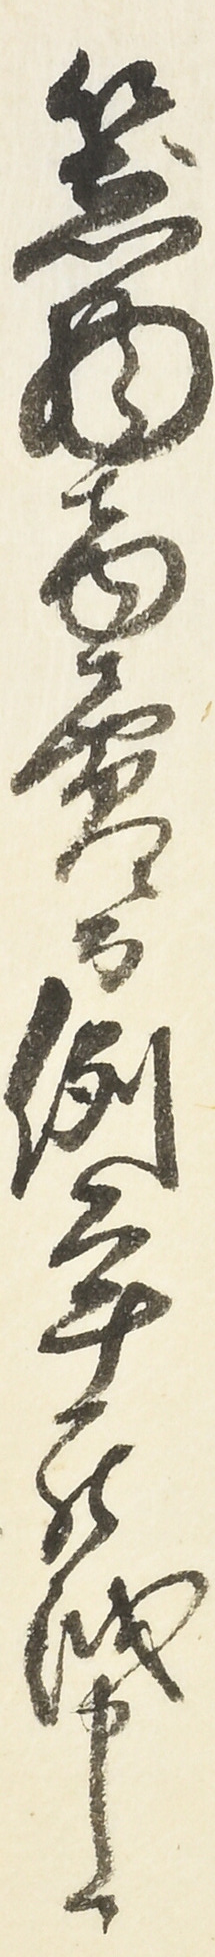器物商売ニ而例年罷越申候
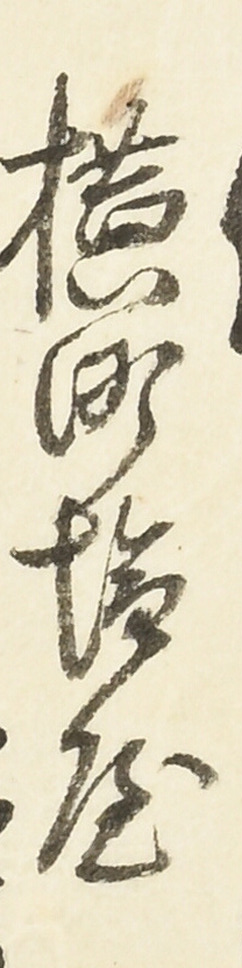横町塩屋
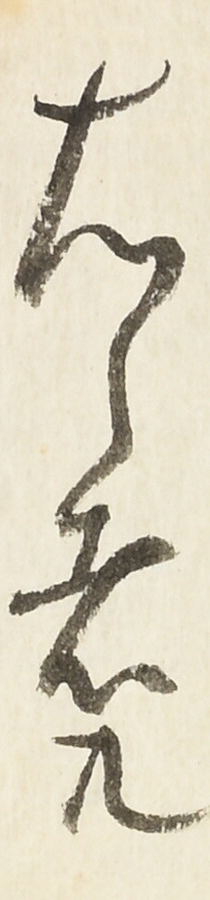右之者共
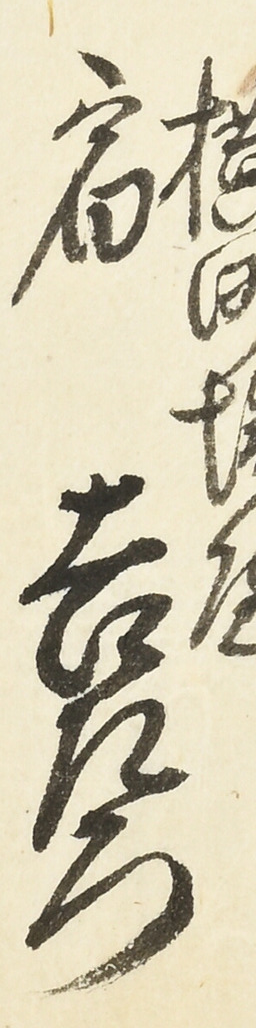宿吉左衛門

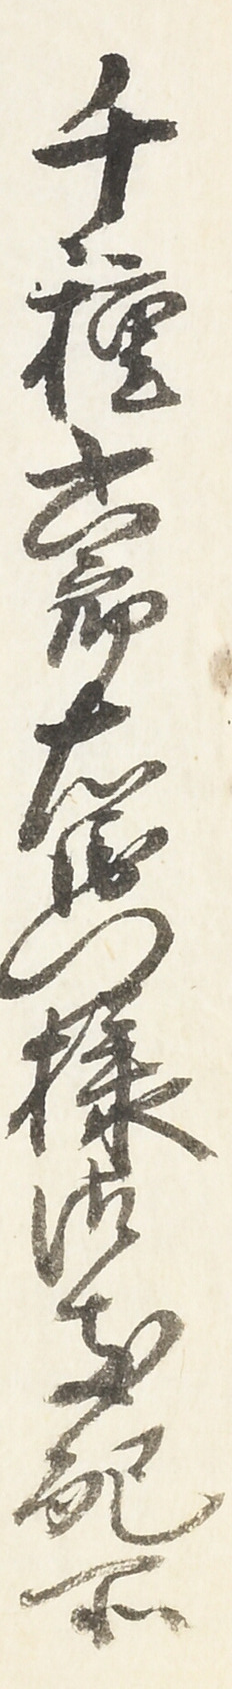千種六郎右衛門様御支配所
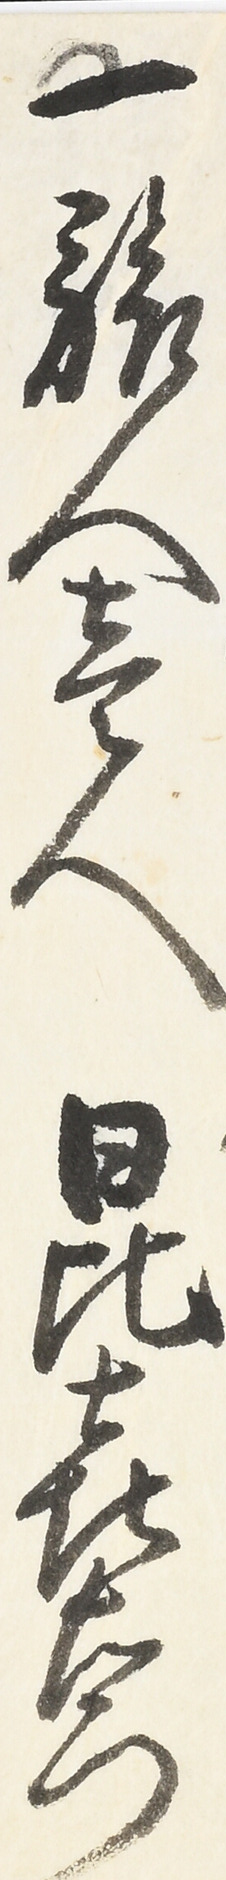一旅人壱人日比喜右衛門
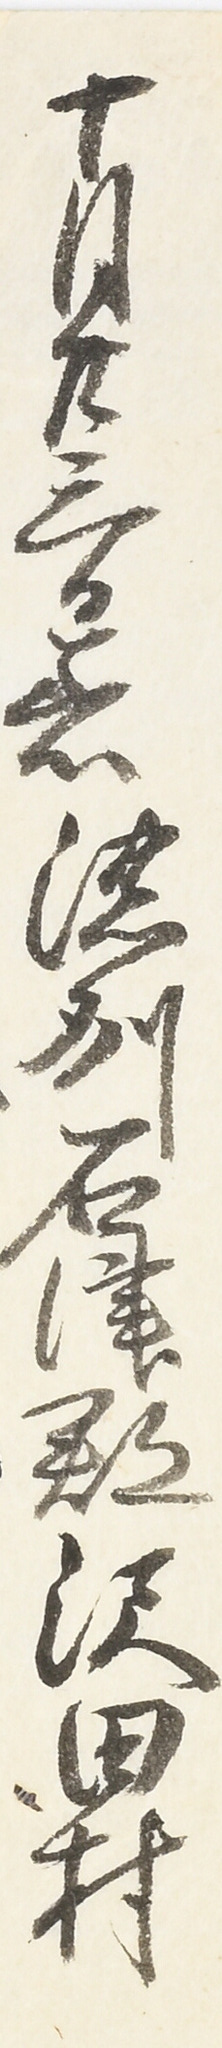十月廿三日着濃州石津郡沢田村
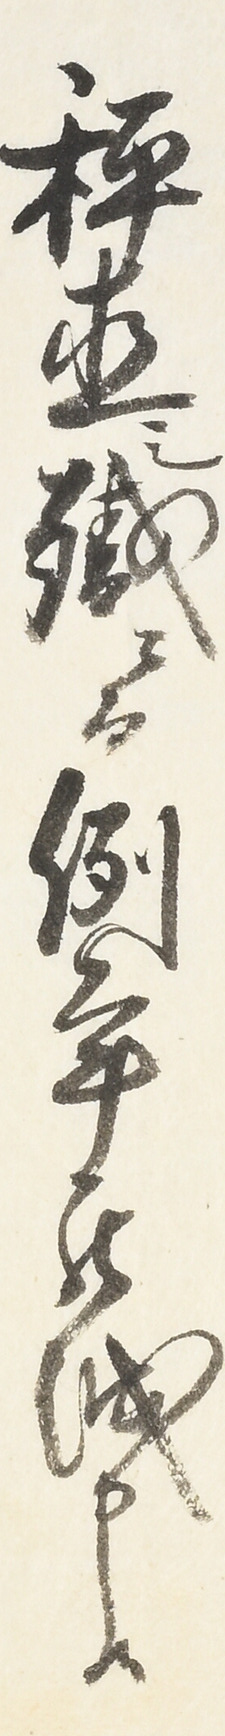秤直シ職ニ而例年罷越申候
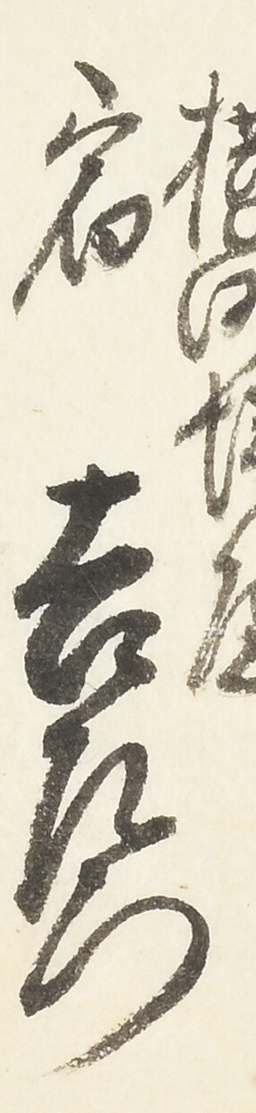宿吉左衛門
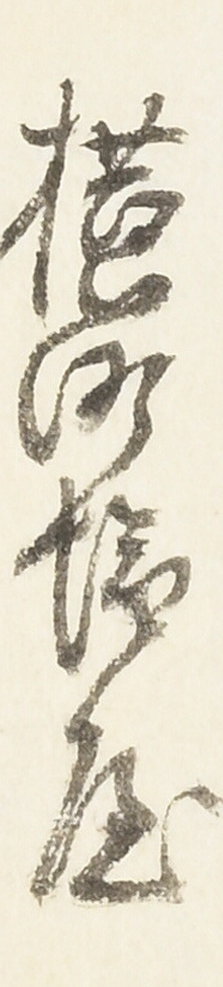横町塩屋
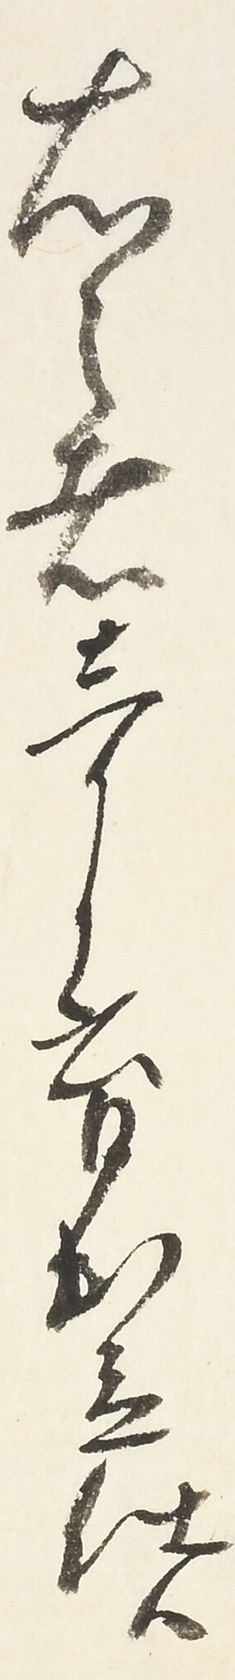右之者十二月六日出立仕候
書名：町中旅人泊控帳
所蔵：伊那市立高遠町図書館・合同会社AMANE
